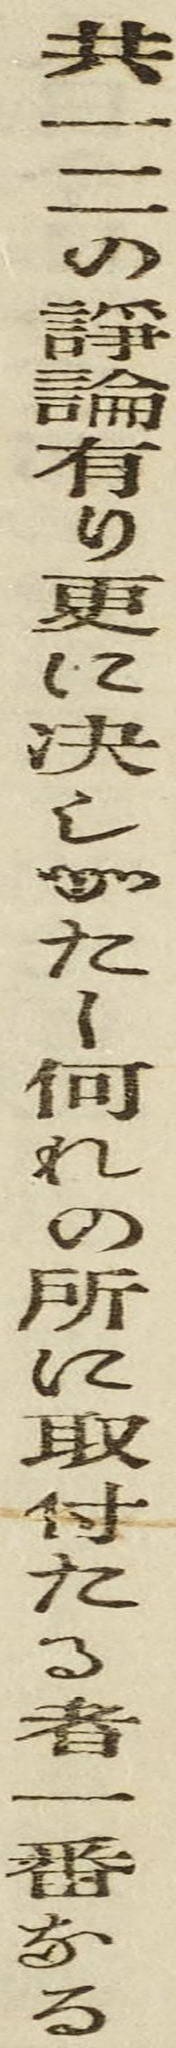共一二の静論有り更に決しかたし何れの所に取付たる者一番なる
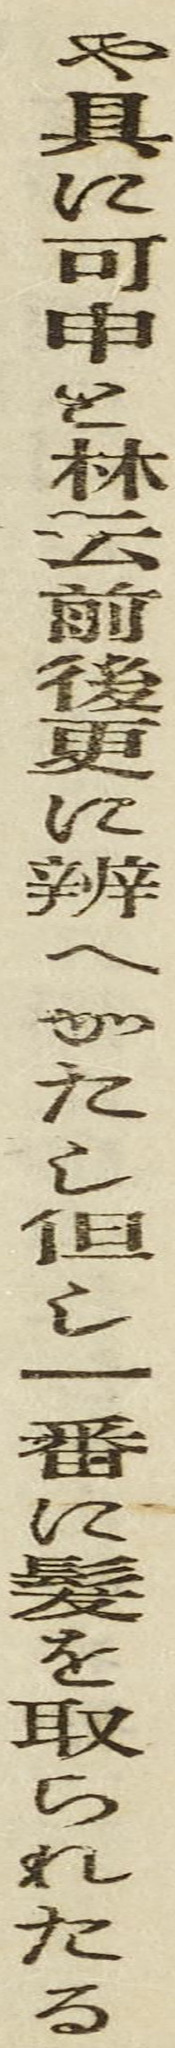や具に可申と林云前後更に弁へかたし但し一番に髪を取られたる
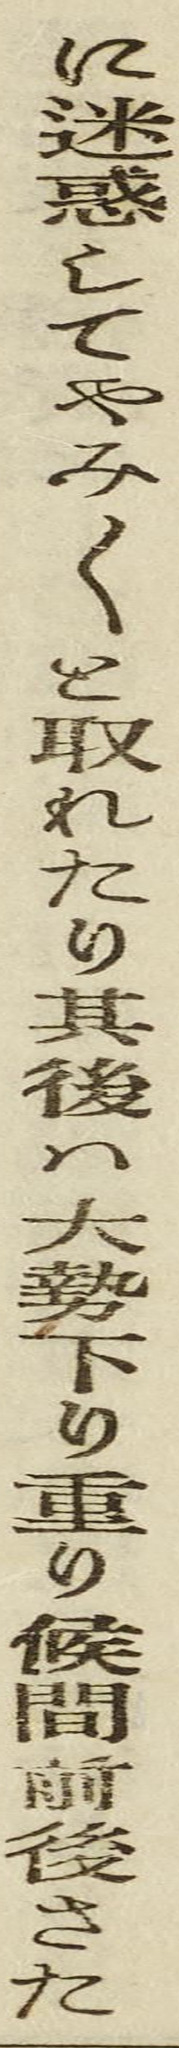に迷惑してやみ〳〵と取れたり其後は大勢下り重り候間前後さた
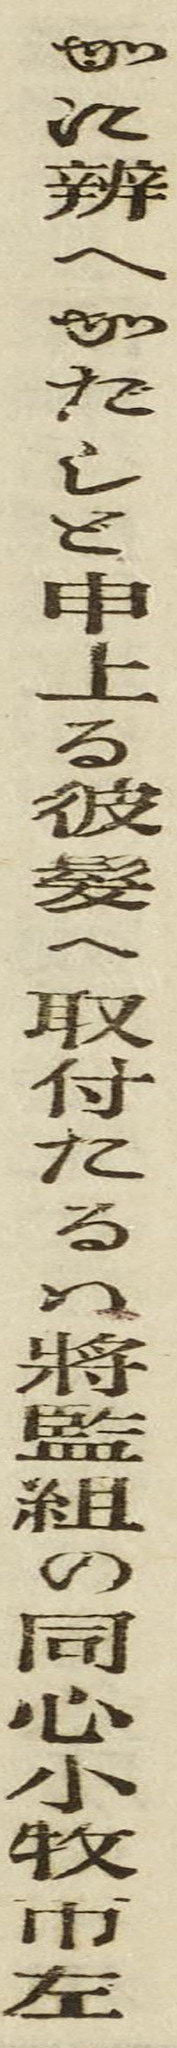かえ弁へかたしと申上る彼髪へ取付たるは将監組の同心小牧市左
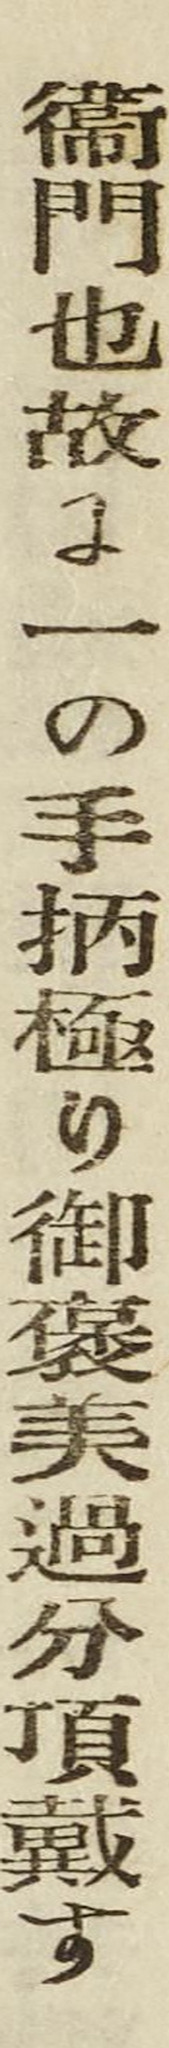衞門也故に一の手抦極り御褒美過分頂戴す
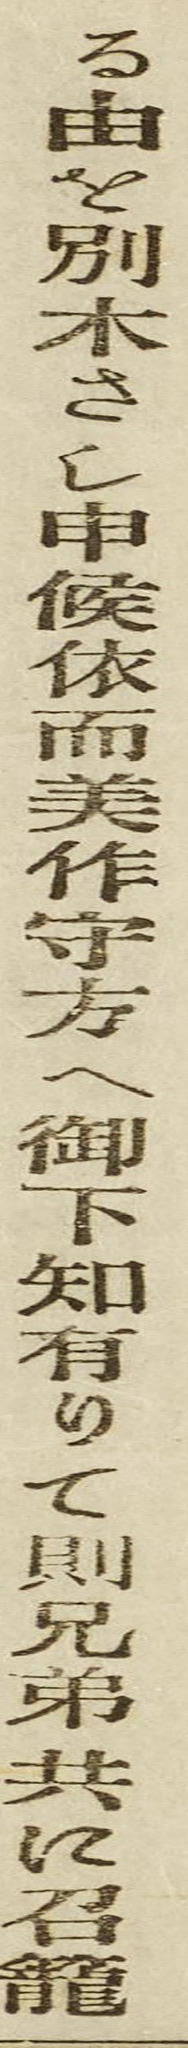る由を別木さし申候依而美作守方へ御下知有りて則兄弟共に召籠
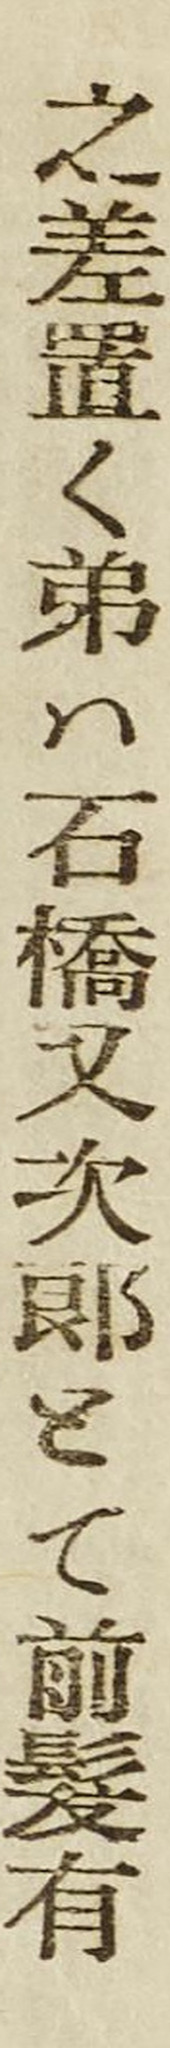之差置く弟は石橋又次郎とて前髪有

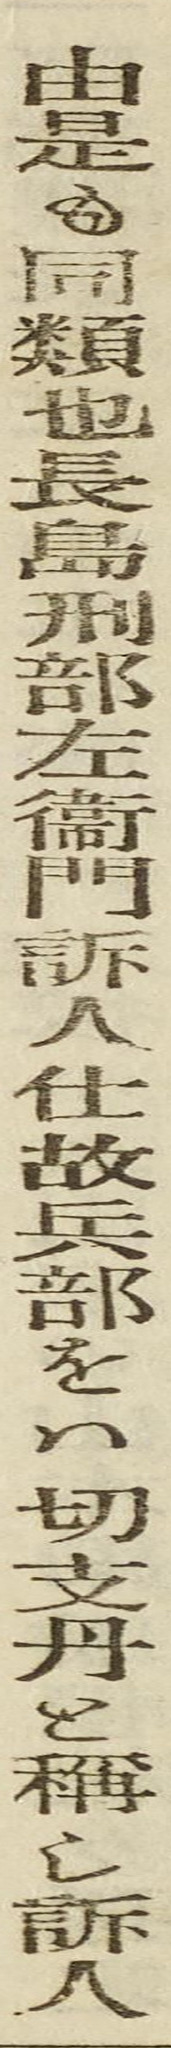由是も同類也長島刑部左衞門訴人仕故兵部をは切支丹と称し訴人
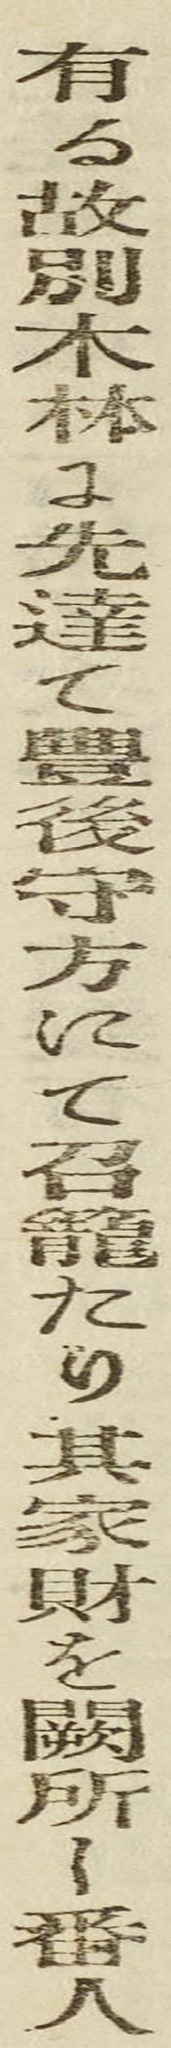有る故別木林に先達て豊後守方にて召籠たり其家財を闕所し番人
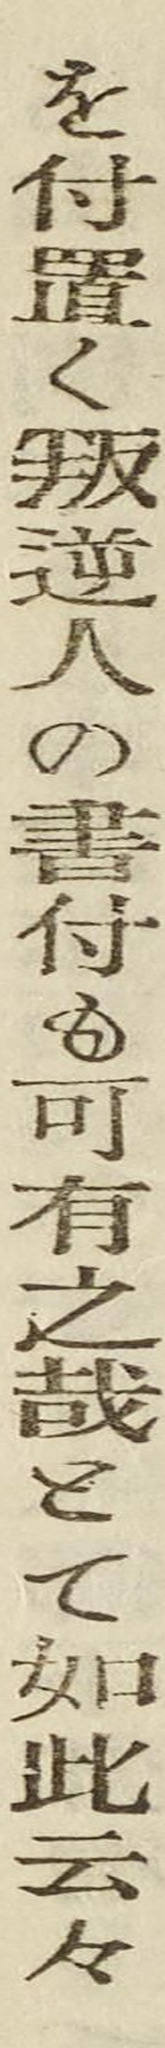を付置く叛逆人の書付も可有之哉とて如此云々
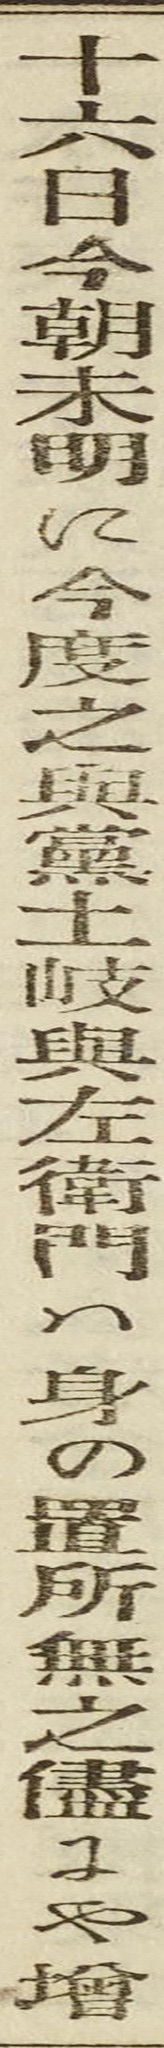十六日今朝未明に今度之与党土岐与左衛門は身の置所無之侭にや増
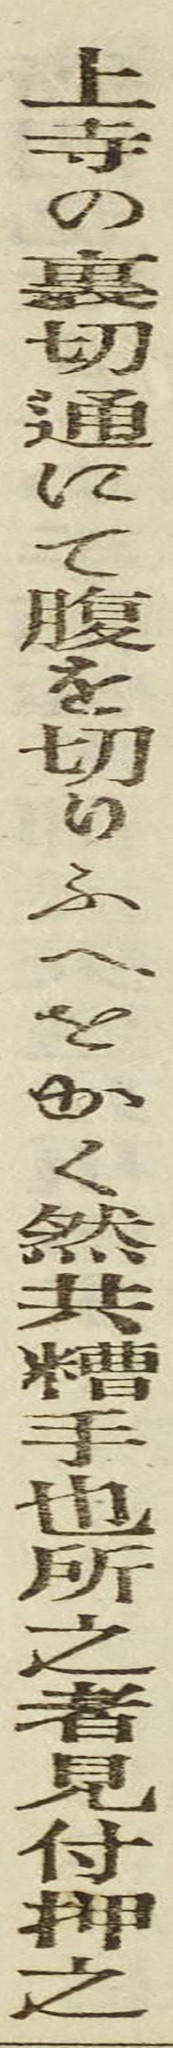上寺の裏切通にて腹を切りふへをかく然共糟手也所之者見付推之
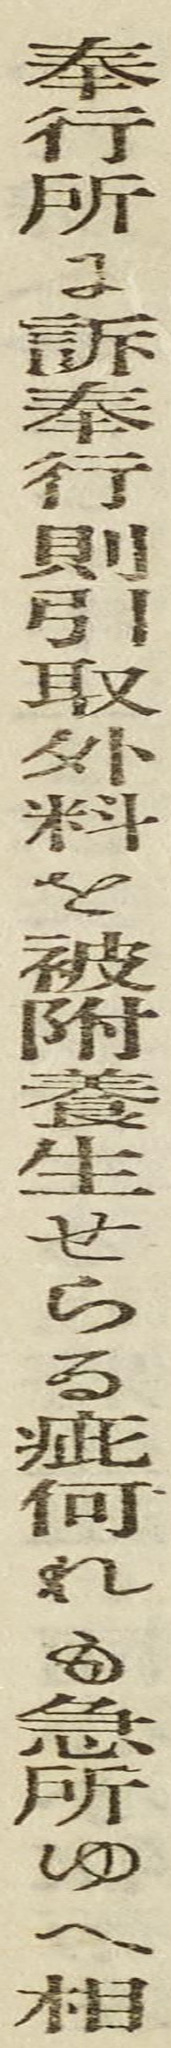奉行所に訴奉行則引取外料を被附養生せらる疵何れも急所ゆへ相
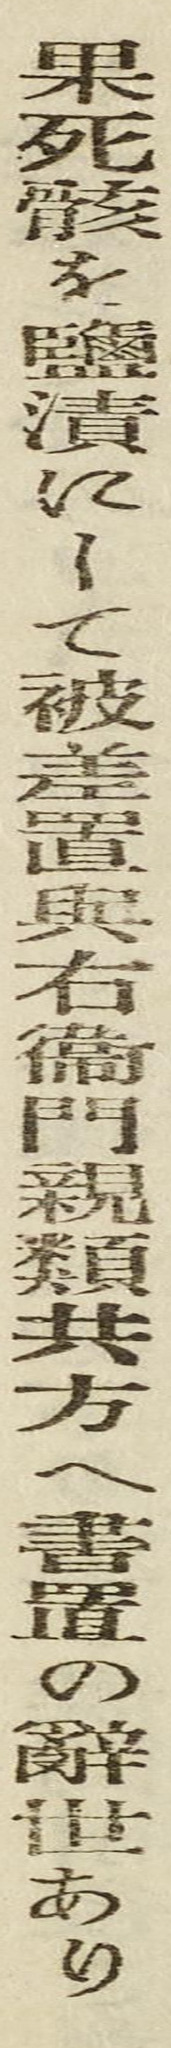果死骸を塩漬にして被差置与右衞門親類共方へ書置の辞世あり
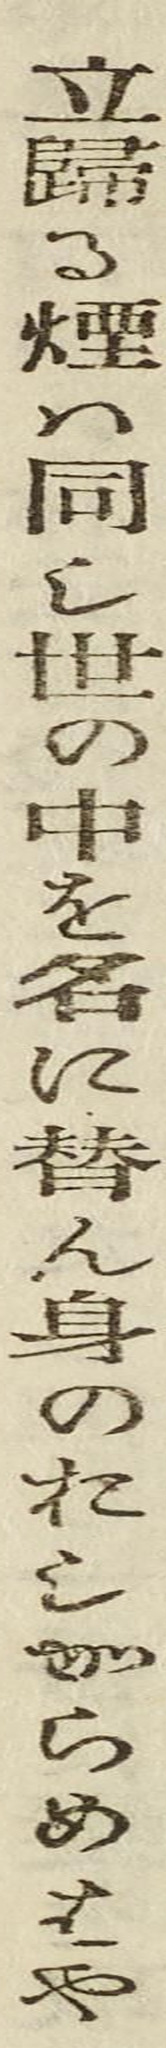立帰る煙は同し世の中を名に替ん身のたしからめむや
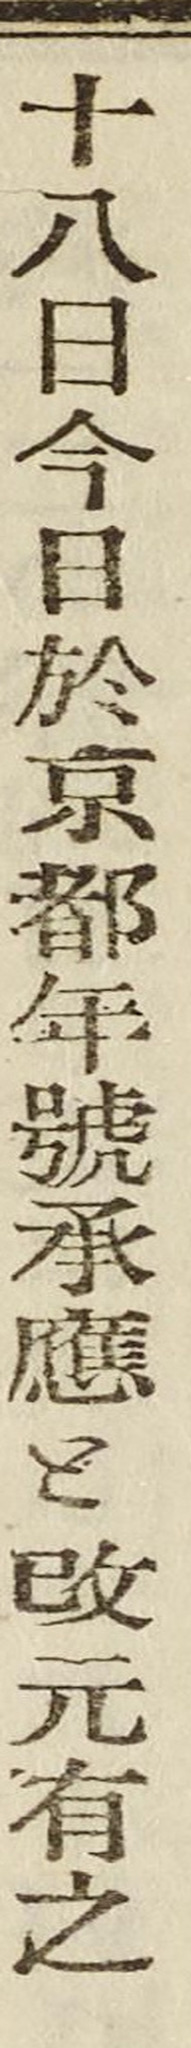十八日今日於京都年号承応と改元有之
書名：史籍集覽　朝鮮陣古文・細井廣澤記・颶風紀事・天明七年將軍宣下次第書　全
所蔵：東京大学地震研究所図書室 Earthquake Research Institute Library, The University of Tokyo, JAPAN
